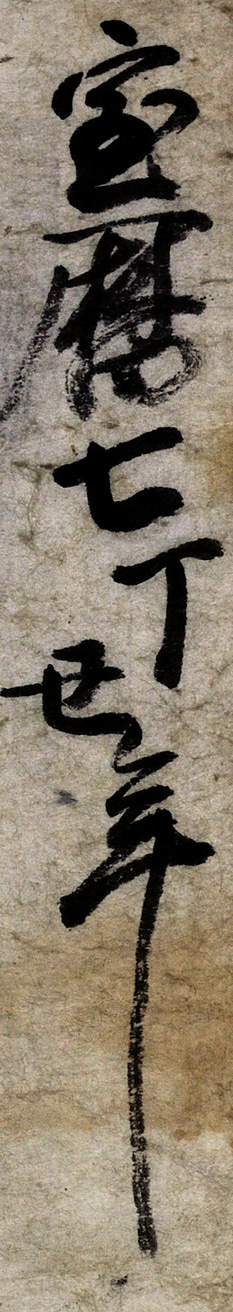宝暦七丁丑年
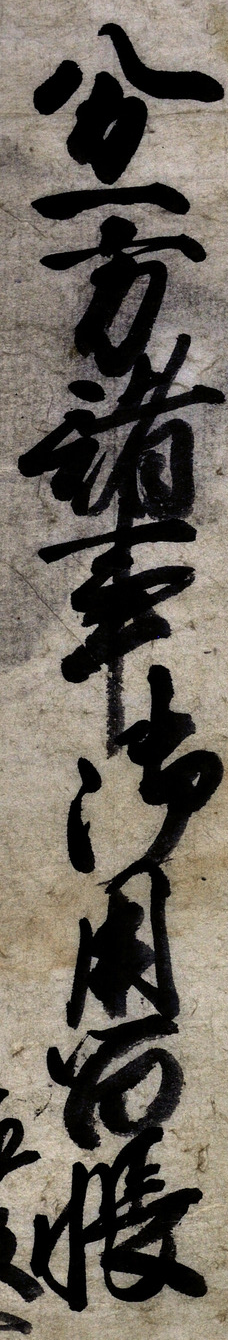分一方諸事御用留帳
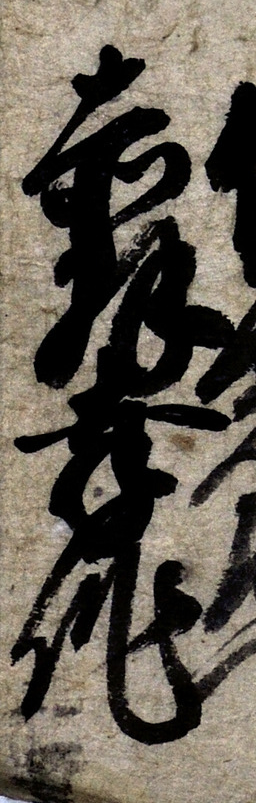赤羽幸作

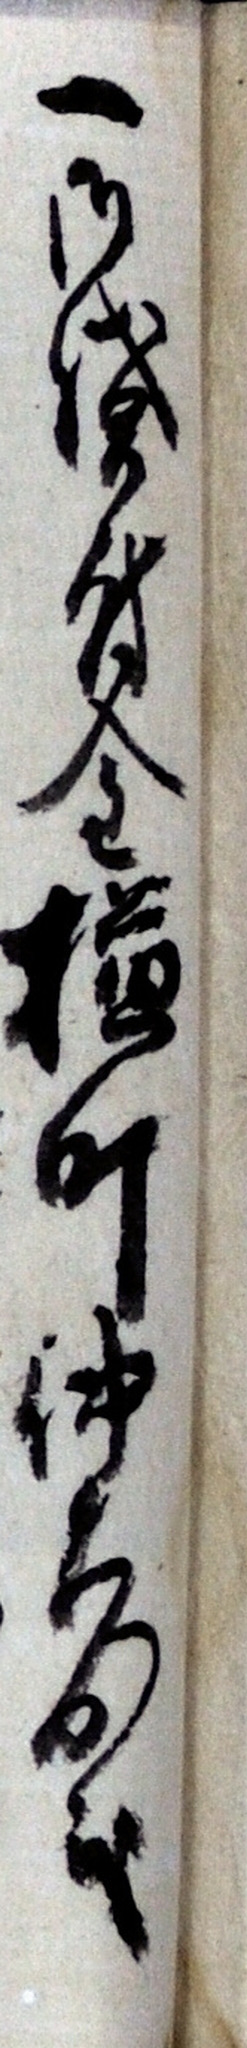一御貸付金横町仲右衛門義
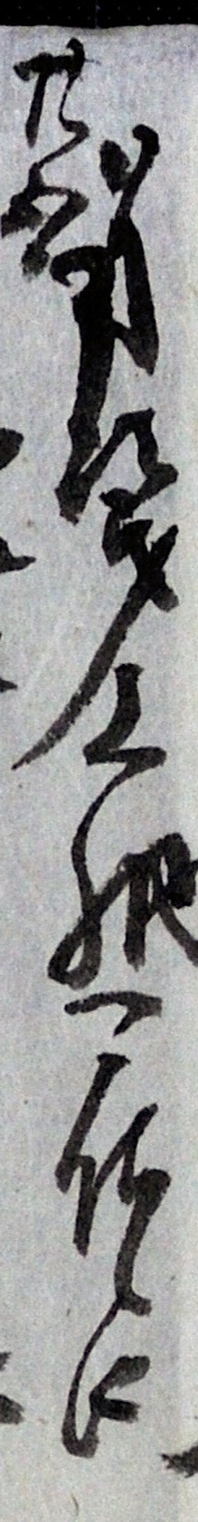御用次第上納可仕候由
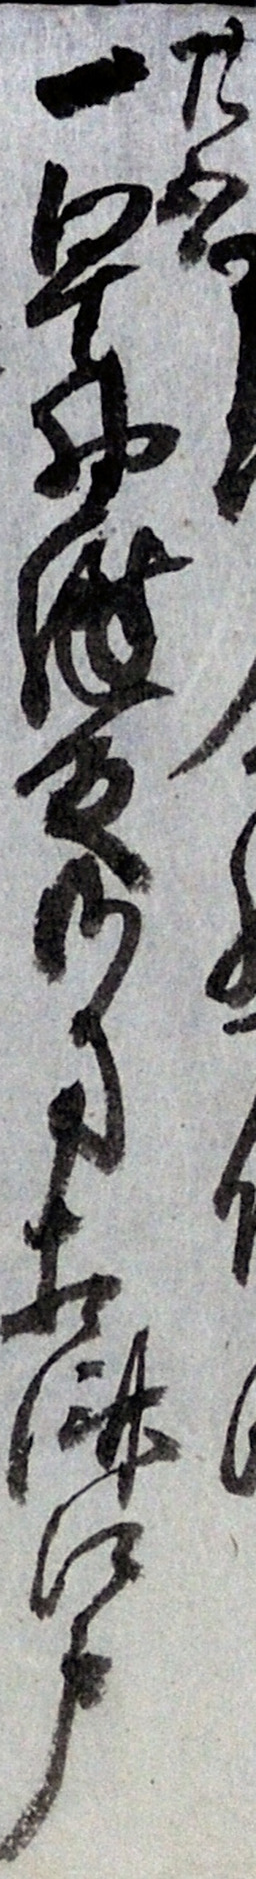一早野縫殿御用相済江戸
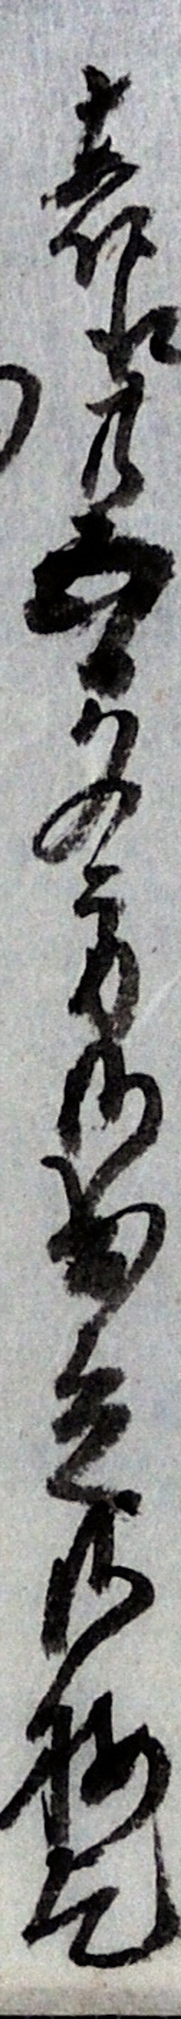表え廿五日夕方御出立御暇乞
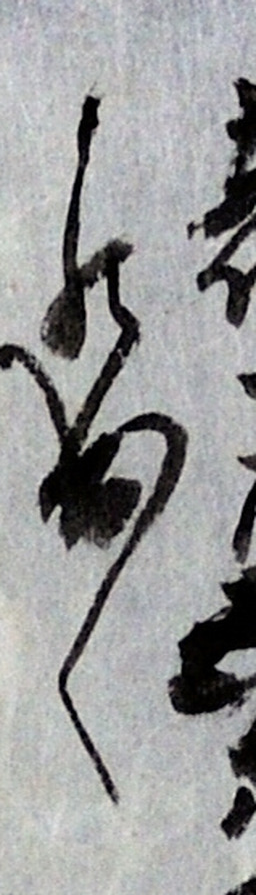罷出候
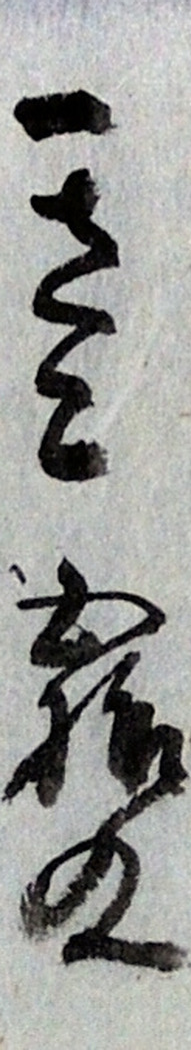一さこ五拾九
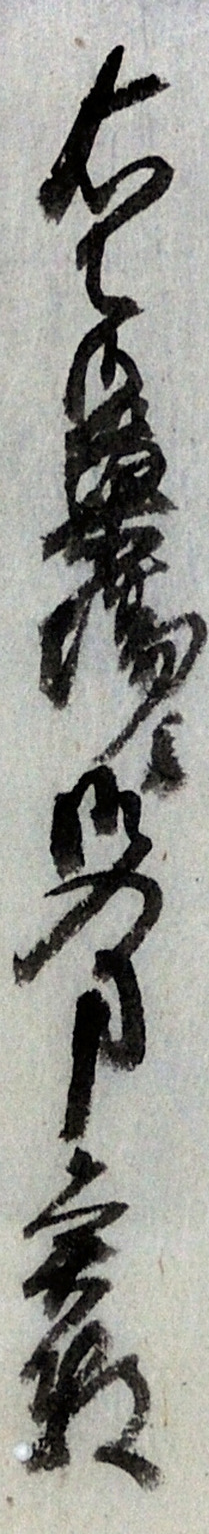右は御簗場え御入用魚数
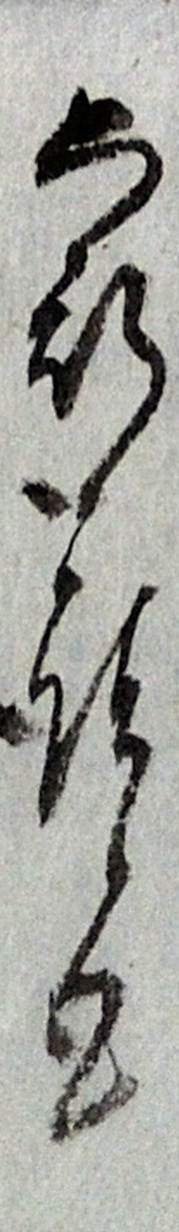如斯御座候以上
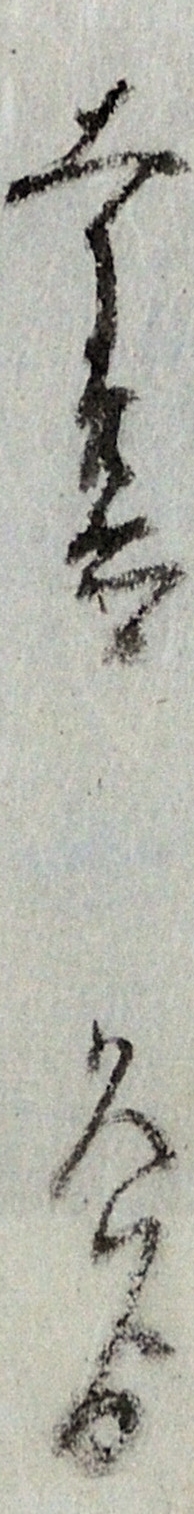十一月廿六日久左衛門
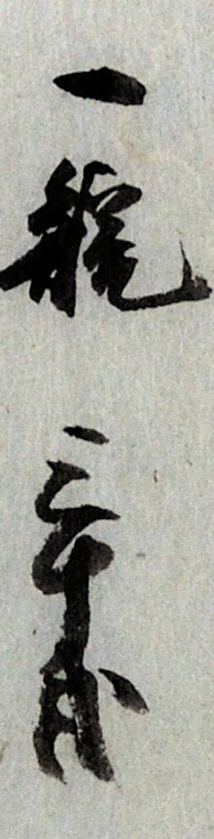一鯇三十弐
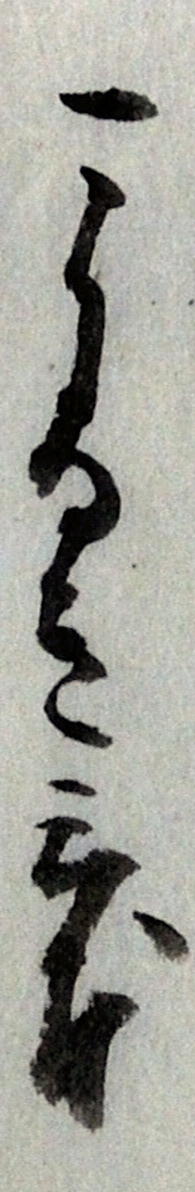一うなき三本
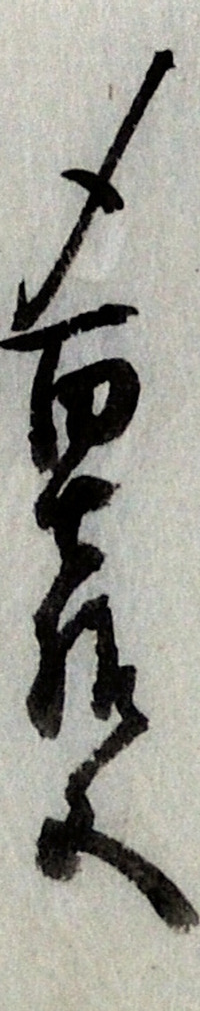〆百七拾五
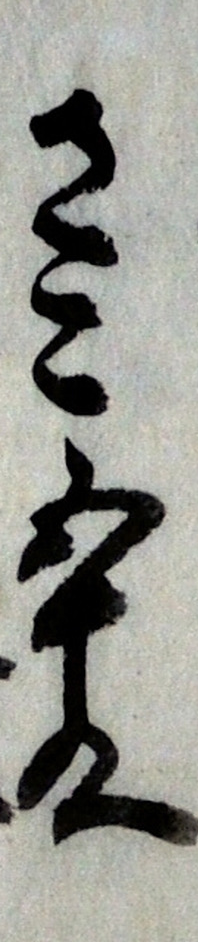さこ五十九
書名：分一方諸事御用留帳
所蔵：伊那市立高遠町図書館・合同会社AMANE
